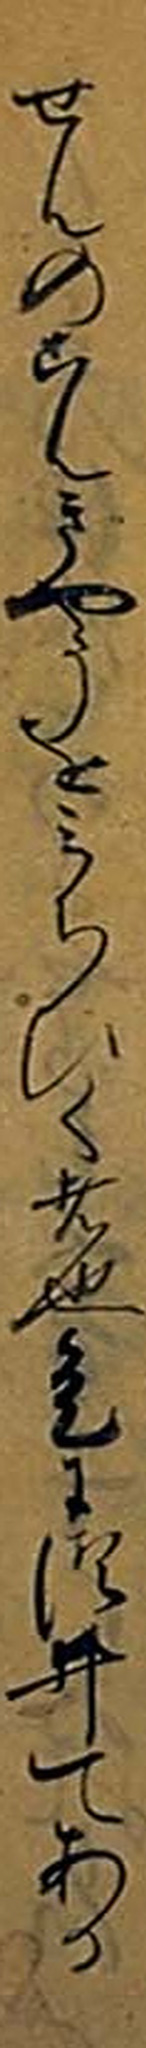せんのこんぎやうをみちひくもの也是につゐてある
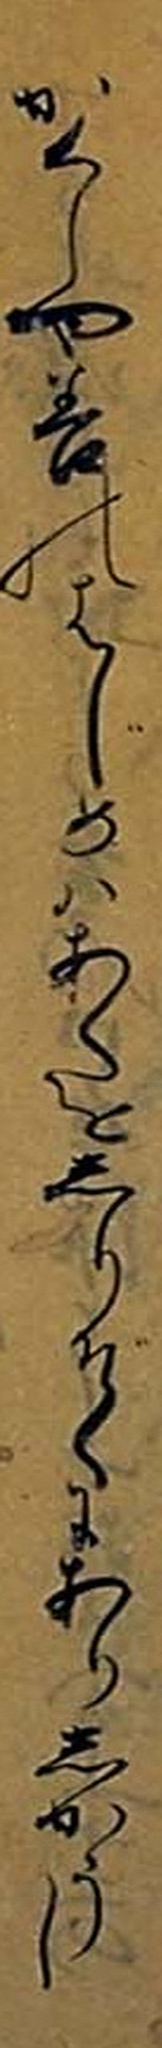かくしや善のはしめはあくをしりぞくにありしかうし
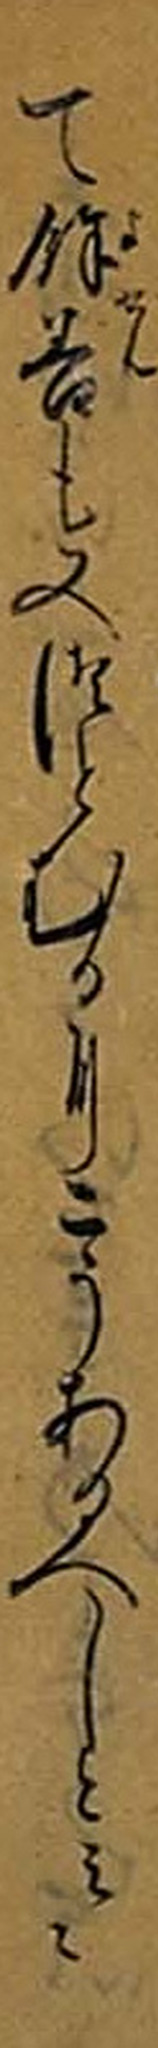て余善も又つとむるにこそあるへしと云々
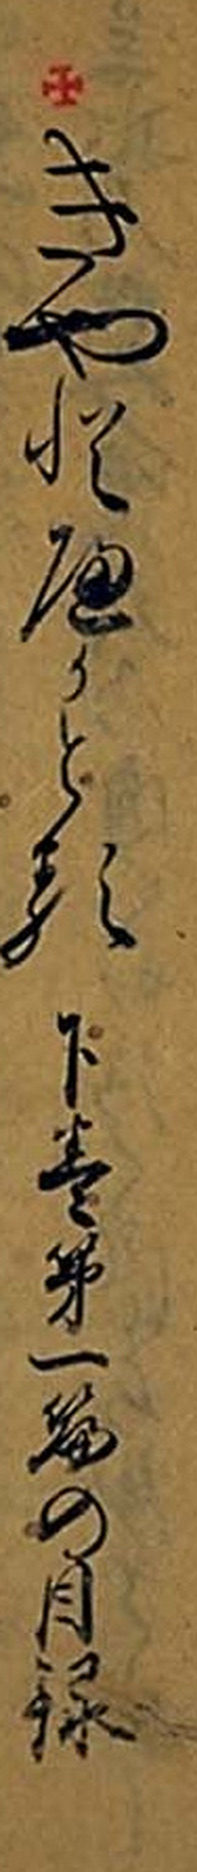✙きやとへかとる下巻第一篇の目録
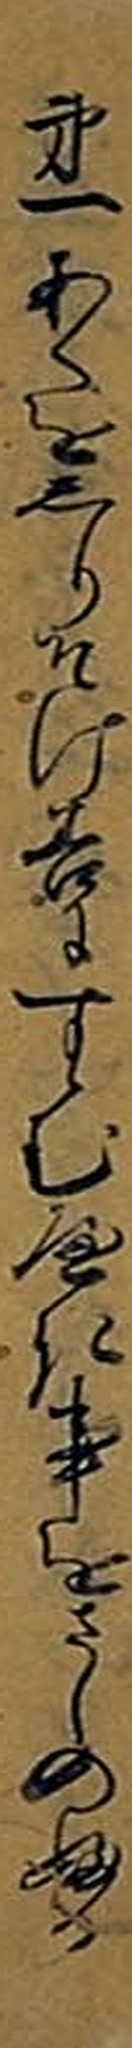第一あくをしりそけ善にすゝむへき事をさしのふる
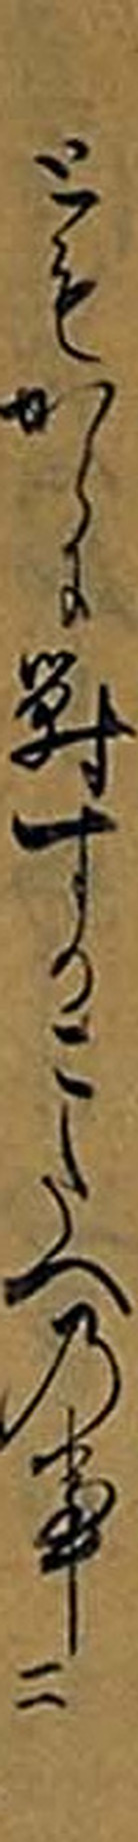ともからに対するこたへの事二
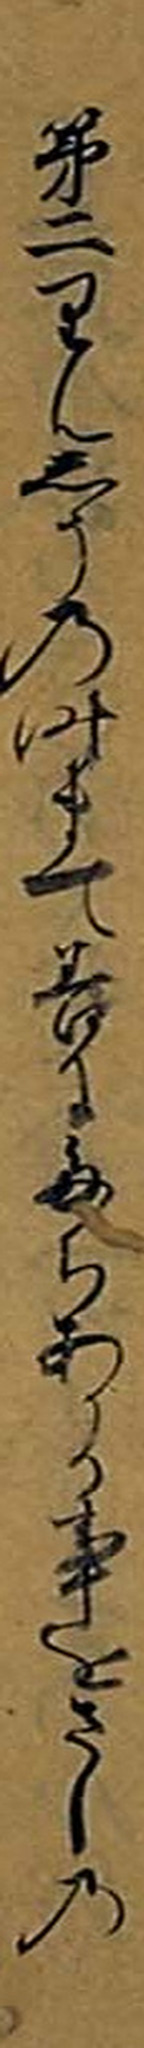第二りんしうの時まて善にたちあかる事をさしの
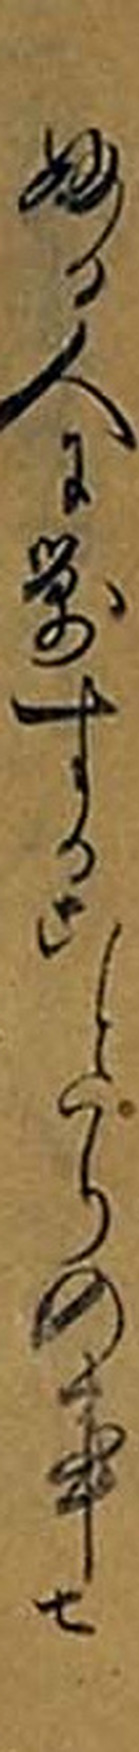ふる人に対することはりの事七
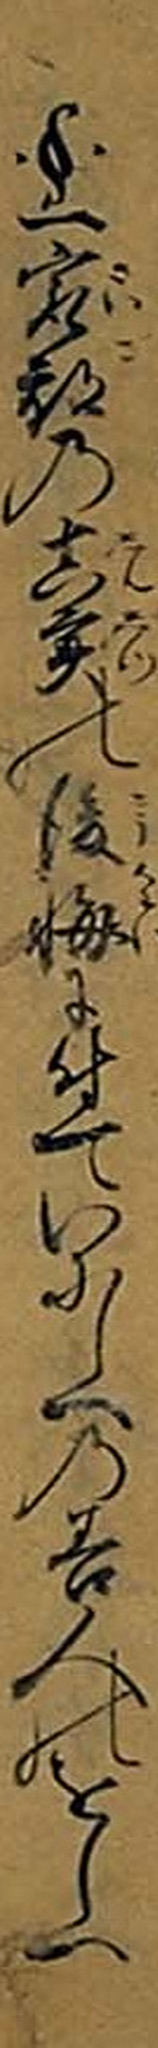§一最期の真実の後悔に付ていにしへの善人のをしへ
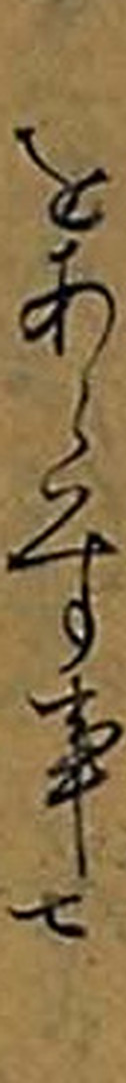をあらはす事七
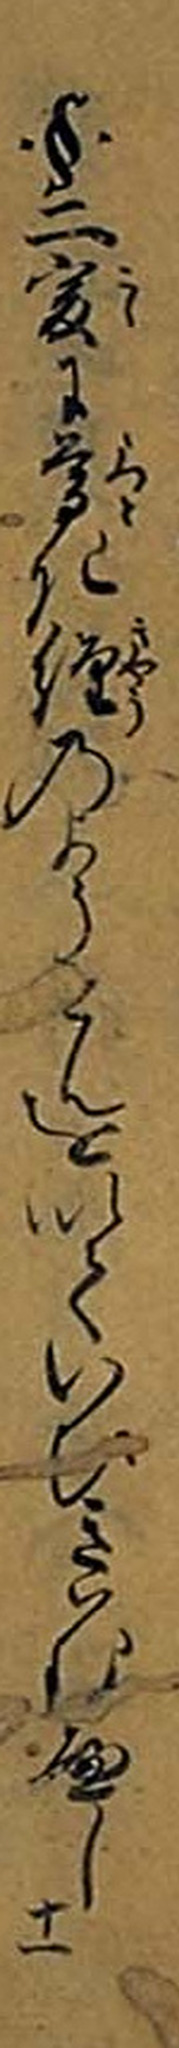§二爰に尊き経のようてんを以ていひきはむへし十一
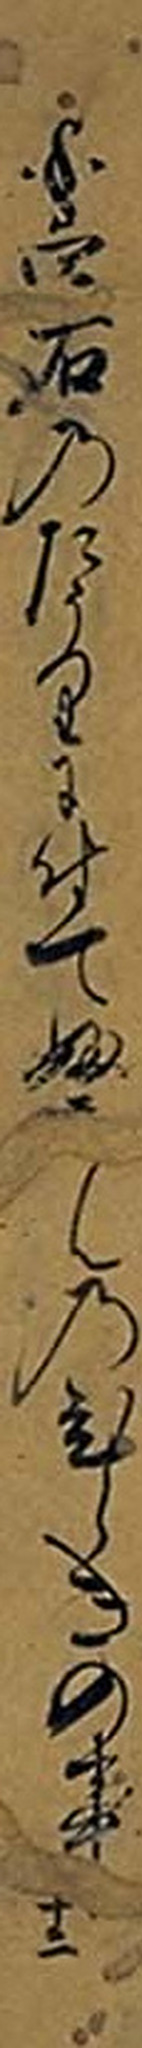§四右のたうりに付てふしんのひらきの事十二

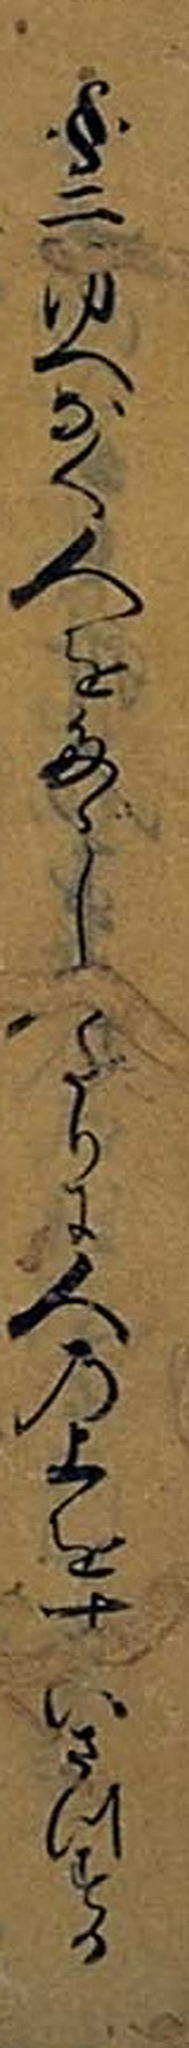§二ゆへなく人をたましみだりに人の上をすいさつする
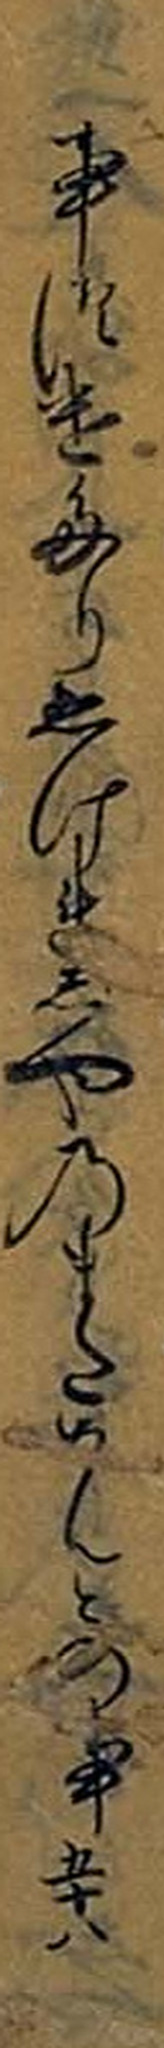事つけたりゑけれしやのまためんとの事五十八
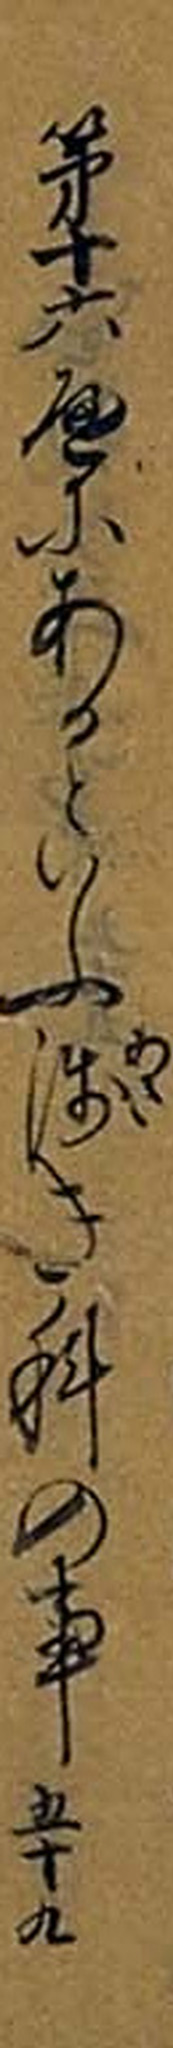第十六へにあるといふ浅き科の事五十九
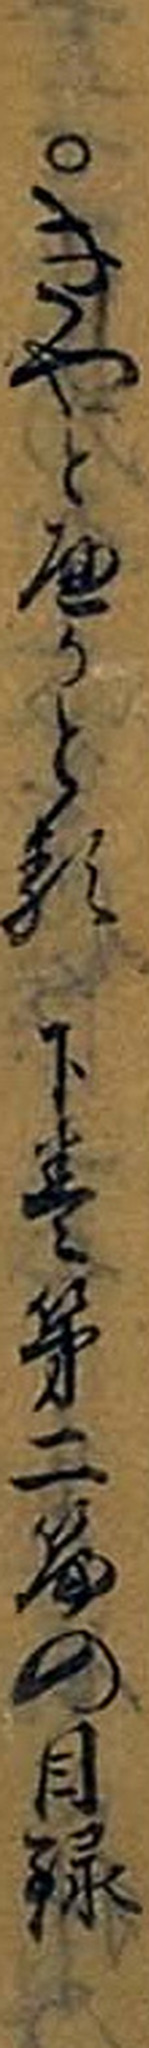〇きやとへかとる下巻第二篇の目録
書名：ぎやどぺかどる
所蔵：東京大学総合図書館 / General Library in the University of Tokyo
